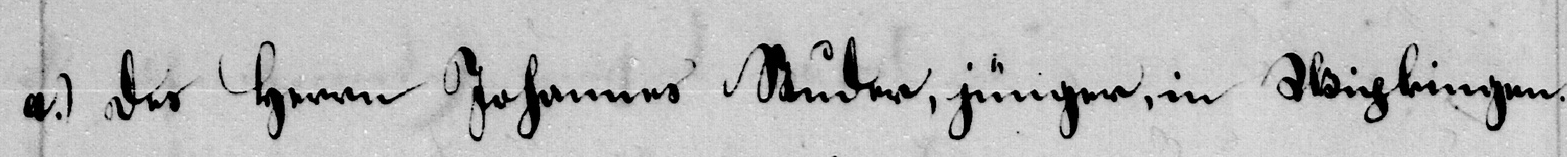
a.) Des Herrn Johannes Studer, jünger, in Wipkingen.
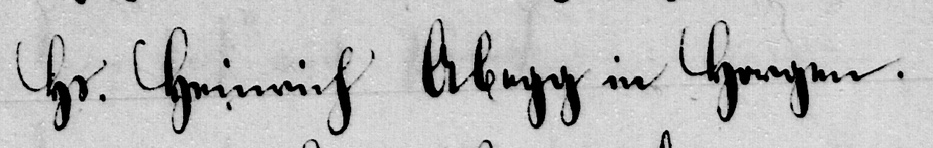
Hs. Heinrich Abegg in Horgen.
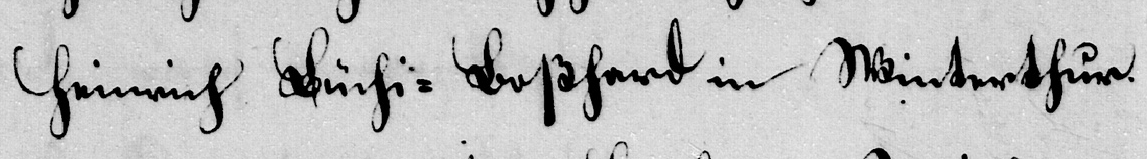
Heinrich Büchi-Boßhard in Winterthur.
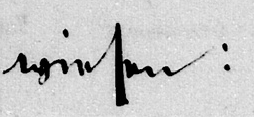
wiesen:
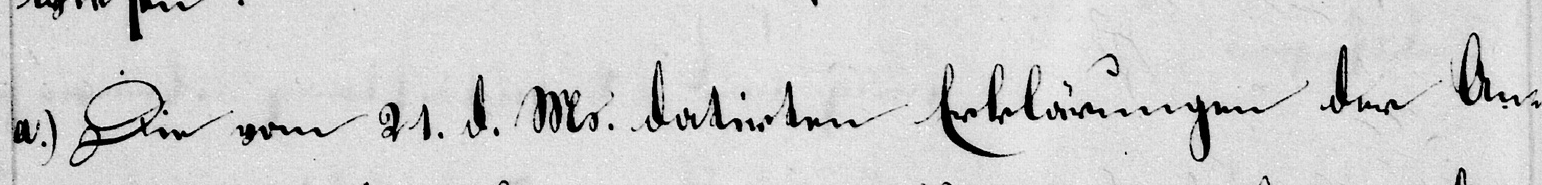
a.) Die vom 21. d. Ms. datirten Erklärungen der An¬
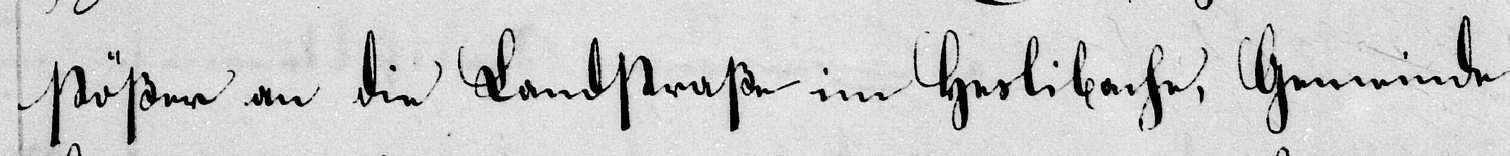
stößer an die Landstraße im Heslibache, Gemeinde
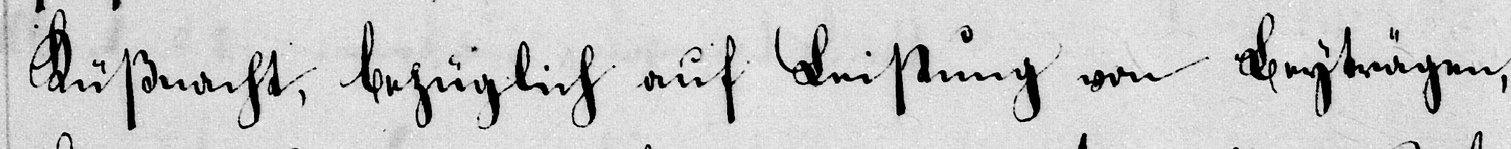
Küßnacht, bezüglich auf Leistung von Beyträgen,
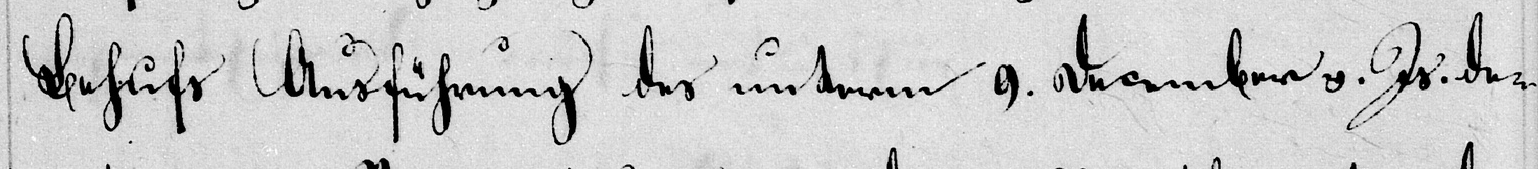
Behufs Ausführung des unterm 9. December v. Js. de¬
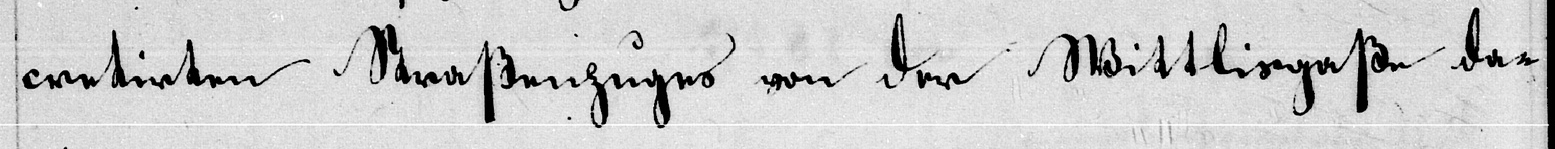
cretirten Straßenzuges von der Wittlisgaße da¬
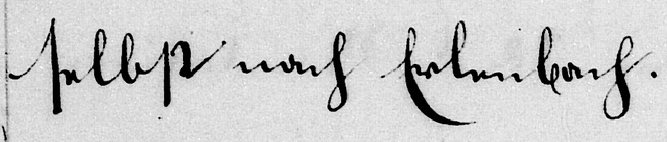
selbst nach Erlenbach.
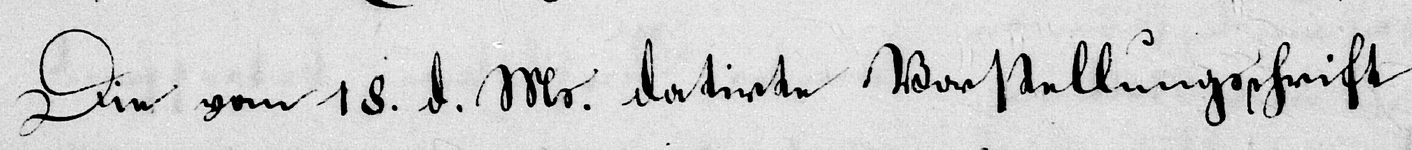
Die vom 18. d. Ms. datirte Vorstellungsschrift
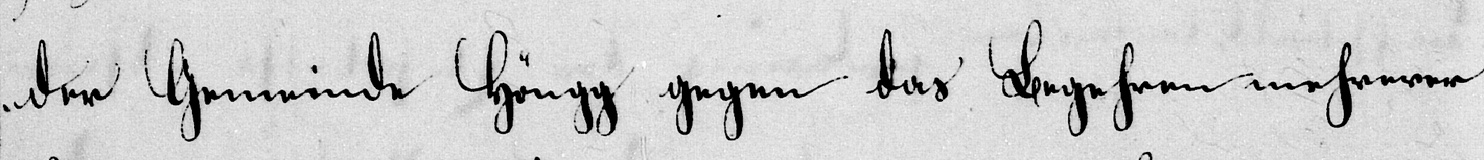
der Gemeinde Höngg gegen das Begehren mehrerer
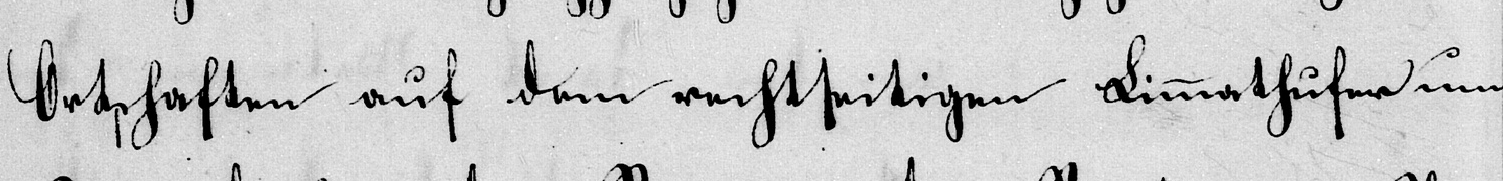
Ortschaften auf dem rechtseitigen Limmathufer um
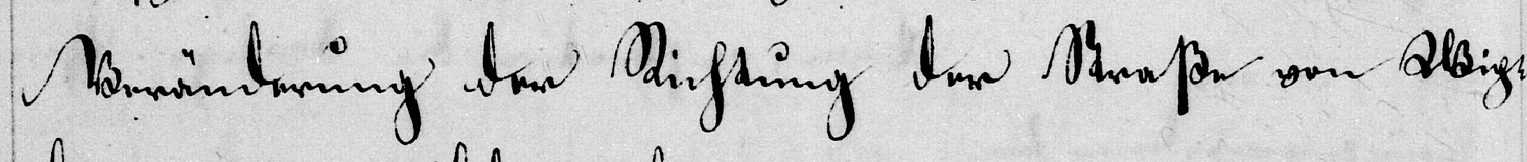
Veränderung der Richtung der Straße von Wip¬
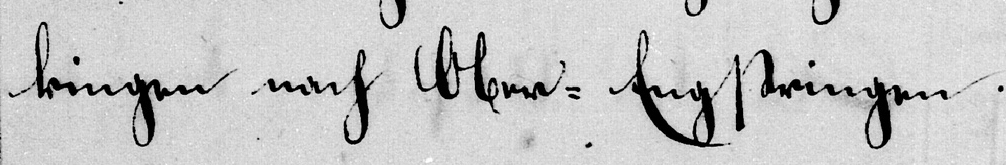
kingen nach Ober-Engstringen.
